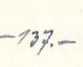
137
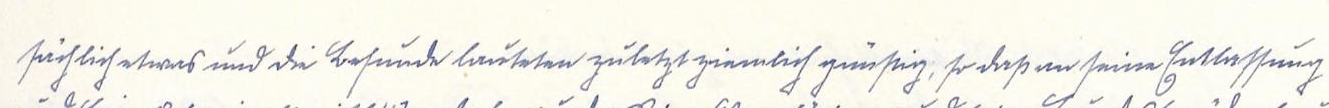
sächlich etwas und die Befunde lautete zuletzt ziemlich günstig, so dass an seine Entlassung,
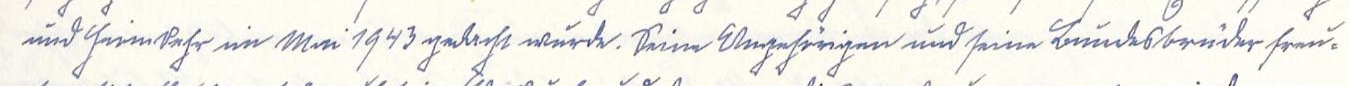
und Heimkehr im Mai 1943 gedacht wurde. Seine Angehörigen und seine Bundesbrüder freu-
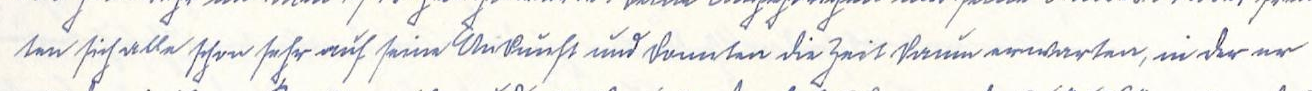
ten sich alle schon sehr auf seine Anskunft und konnten die Zeit kaum erwarten, in der er
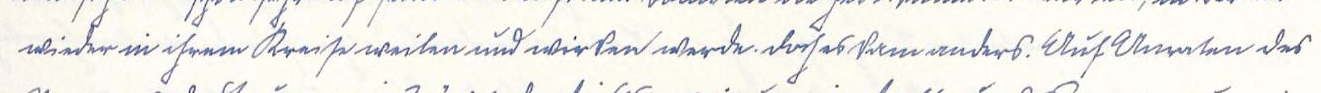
wieder in ihrem Kreise weilen und wirken werde. Doch es kam anders. Auf Anraten des
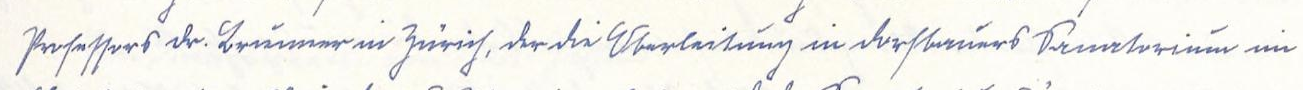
Professors Dr. Brunner in Zürich, der die Oberleitung in Dorfbauers Sanatorium im
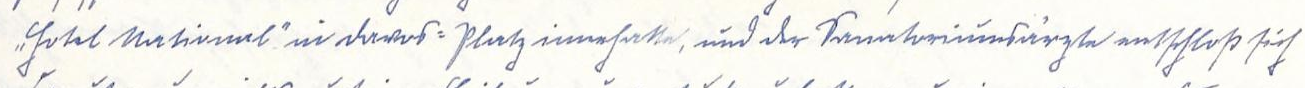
"Hotel National“ in Davos- Platz innehatte, und der Sanatoriumsärzte entschloß sich
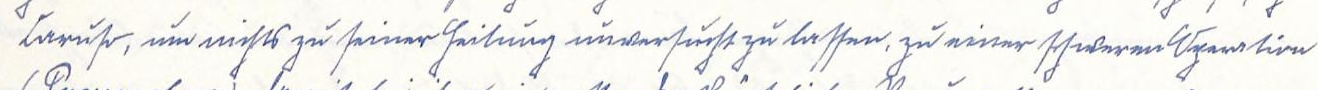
Caruso, um nichts zu seiner Heilung unversucht zu lassen, zu einer schweren Operation
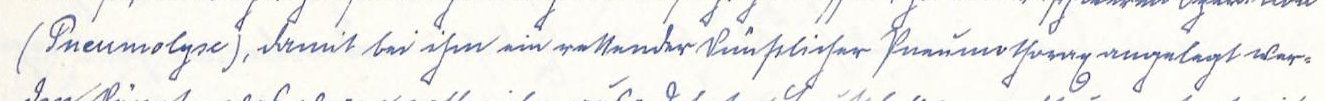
(Pneumolyse), damit bei ihm ein rettender künstlicher Pneumothorax angelegt wer-
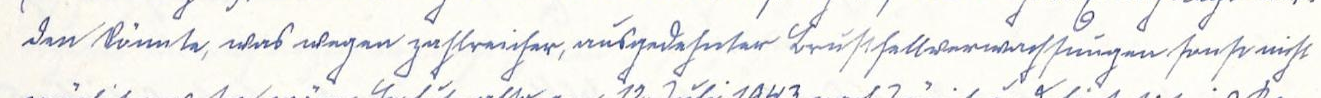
den könnte, was wegen zahlreicher, ausgedehnter Brustfellverwachsungen sonst nicht
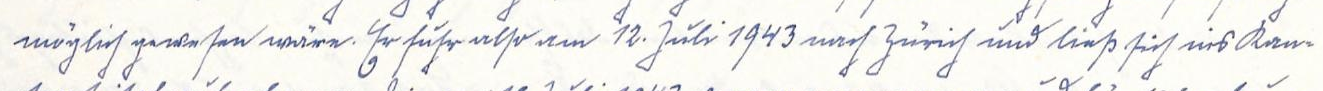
möglich gewesen wäre. Er fuhr also am 12. Juli 1943 nach Zürich und ließ sich ins Kan-
